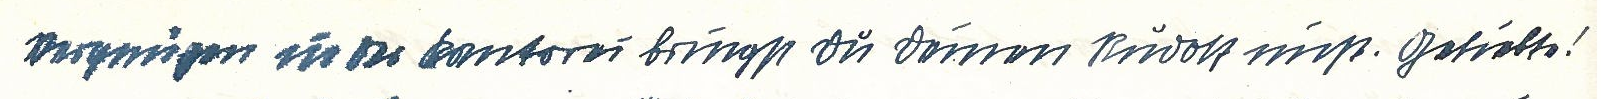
Vergnügen in der Kantorei bringst Du Deinen nicht, Geliebte!
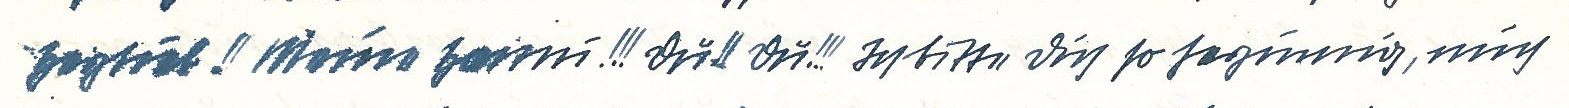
Herzlieb! Meine !!! Du!! Du!!! Ich bitte Dich so herzinnig, mich
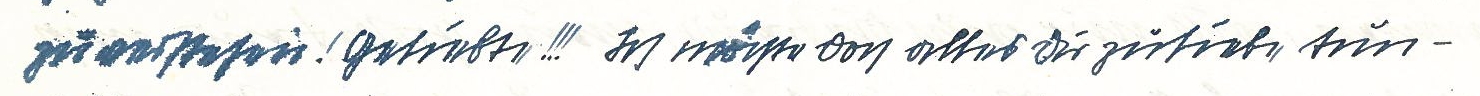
zu verstehen! Geliebte!!! Ich möchte doch alles Dir zuliebe tun –
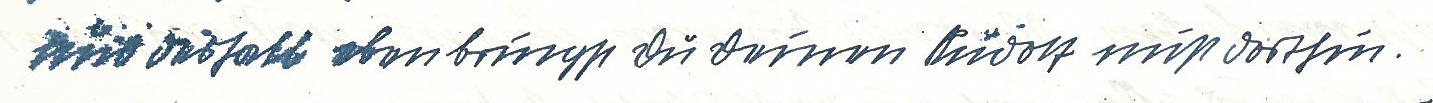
und deshalb eben bringst Du Deinen nicht dorthin.
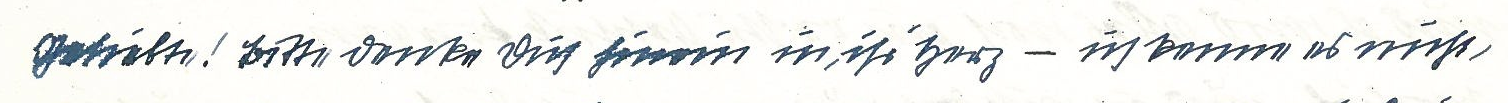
Geliebte! Bitte denke Dich hinein in ‚ihr’ Herz – ich kenne es nicht,
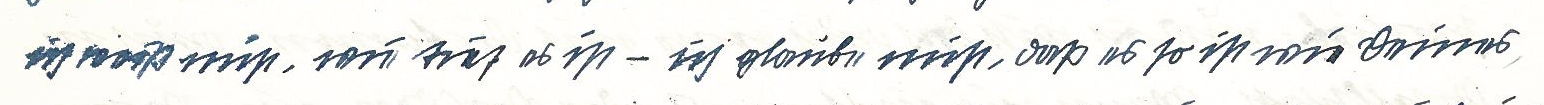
ich weiß nicht, wie tief es ist – ich glaube nicht, daß es so ist wie Deines,
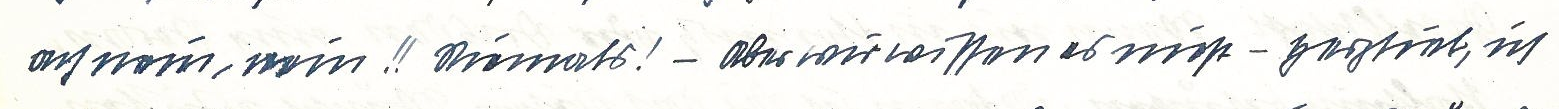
ach nein, nein!! Niemals! – Aber wir wissen es nicht – Herzlieb, ich
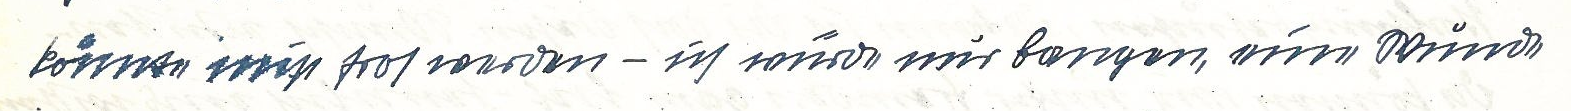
könnte nicht froh werden – ich würde nur bangen, eine Wunde
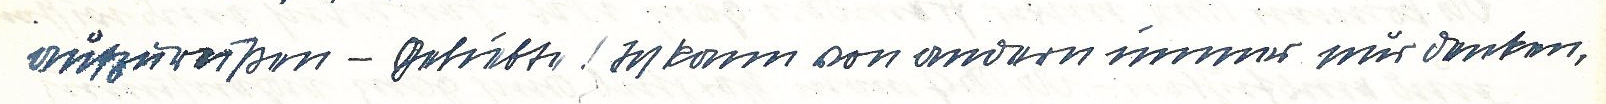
aufreißen – Geliebte! Ich kann von anderen immer nur denken,
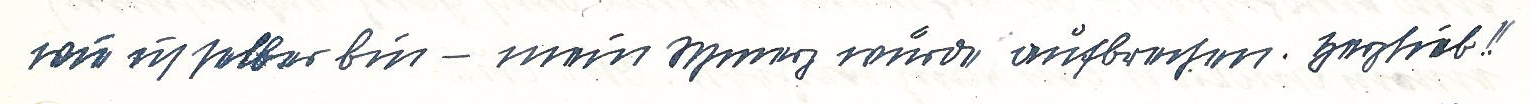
wie ich selber bin – mein Schmerz würde aufbrechen. Herzlieb!!
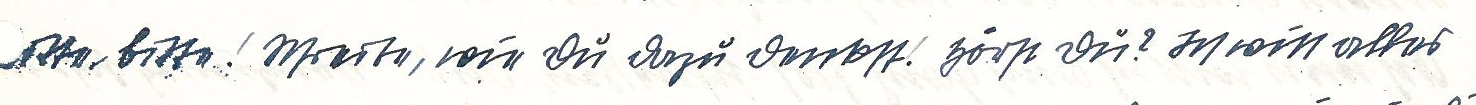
itte, bitte! Schreibe, wie Du dazu denkst. Hörst Du? Ich will alles
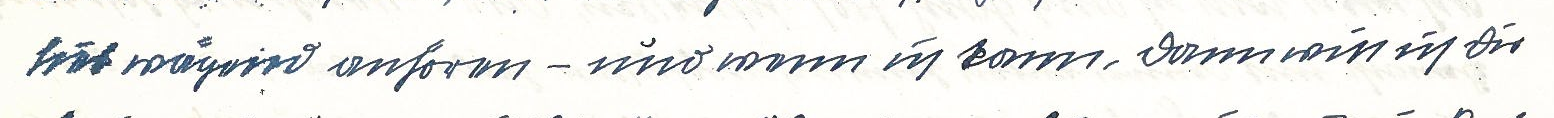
lieb wägend anhören – und wenn ich kann, will ich Dir
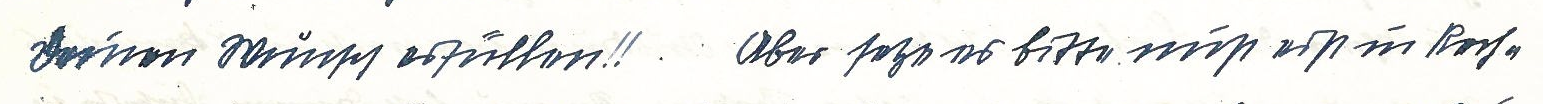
Deinen Wunsch erfüllen!! Aber setze es bitte nicht in Rech¬
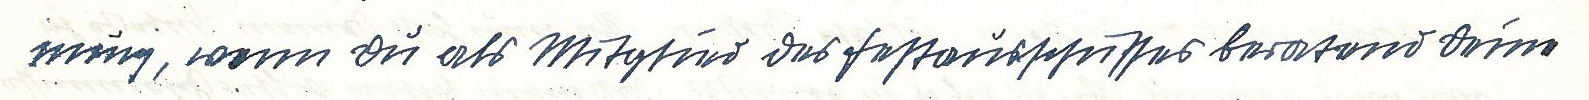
nung, wenn Du als Mitglied des Festausschusses beratend Deine
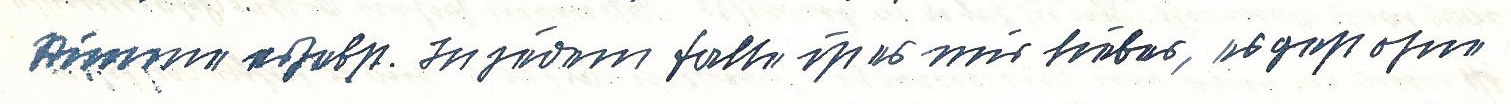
Stimme erhebst. In jedem Falle ist es mir lieber, es geht ohne
